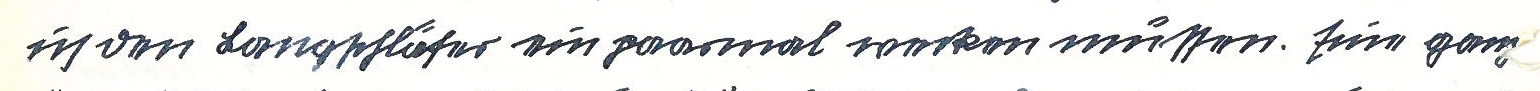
ich den Langschläfer ein paarmal wecken müssen. Eine gan
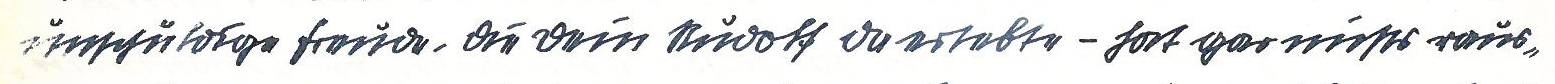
unschuldige Freude, die Dein da erlebte – hat gar nichts raus¬
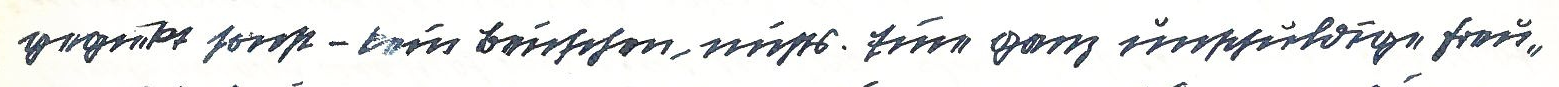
geguckt sonst – kein Beinchen, nichts. Eine ganz unschuldige Freu¬
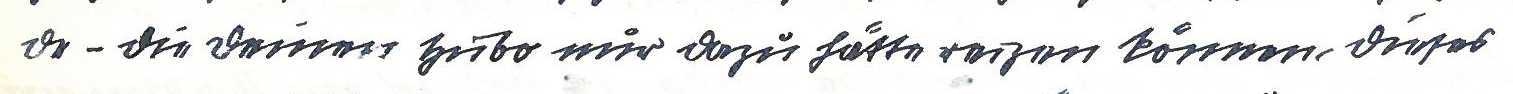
de – die Deinen Hubo nur dazu hätte reizen können, dieses
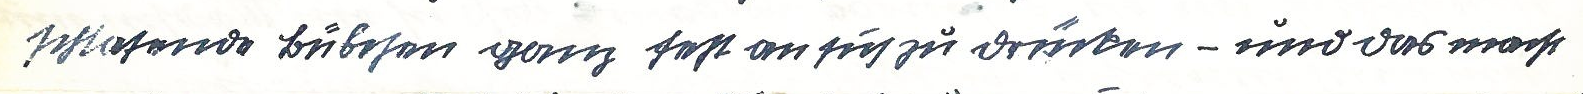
schlafende Bübchen ganz fest an sich zu drücken – und das macht
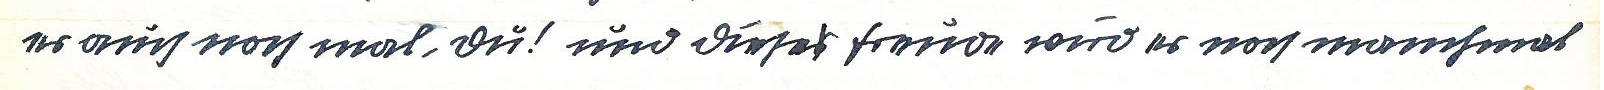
er auch noch mal, Du! und dieses Freude wird er noch manchmal
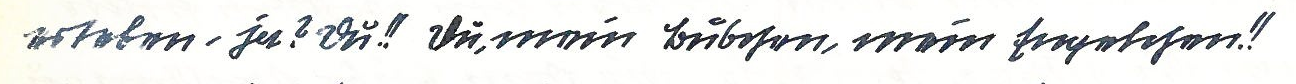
erleben, ja? Du!! Du, mein Bübchen, mein Engelchen!!
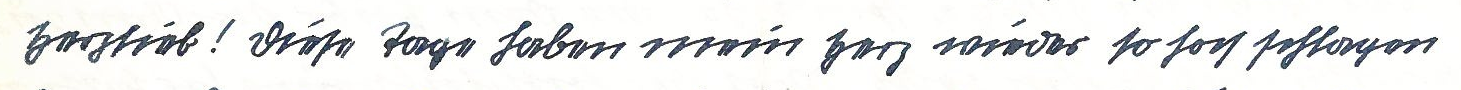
Herzlieb! Diese Tage haben mein Herz wieder so hoch schlagen
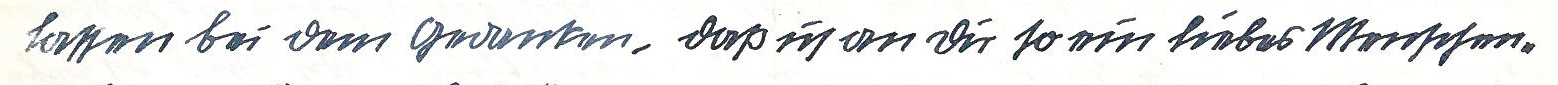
lassen bei dem Gedanken, daß ich an Dir so ein liebes Menschen¬
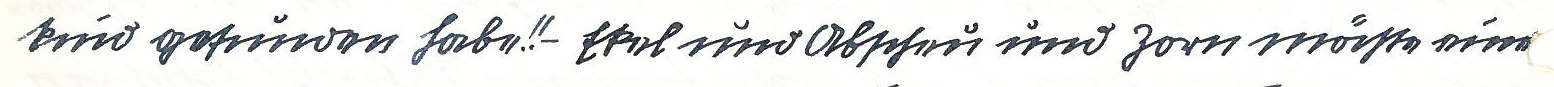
kind gefunden habe!! – Ekel und Abscheu und Zorn möchte eine
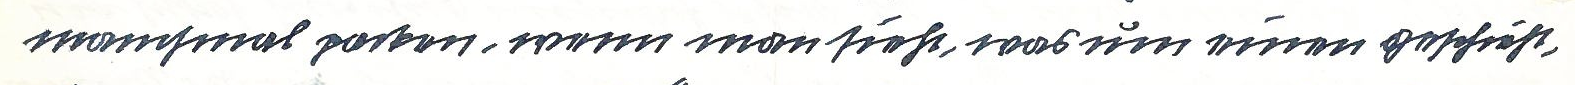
manchmal packen, wenn man sieht, was um einen geschieht,
